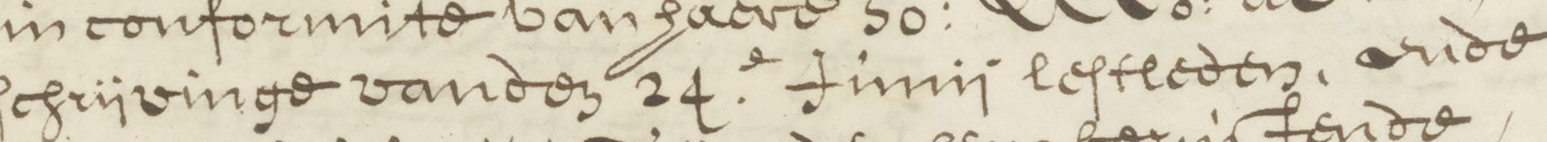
schrijvinge vanden 24e. Junij lestleden, ende
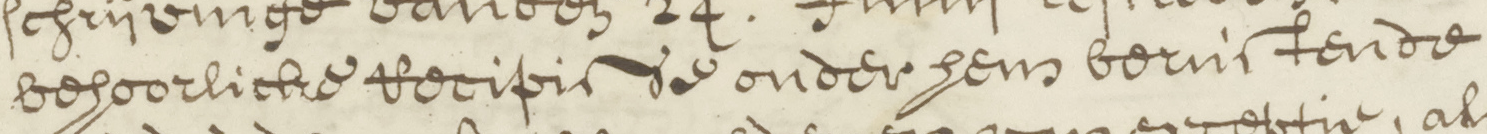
behoorlicke Recipisse onder hem berustende,
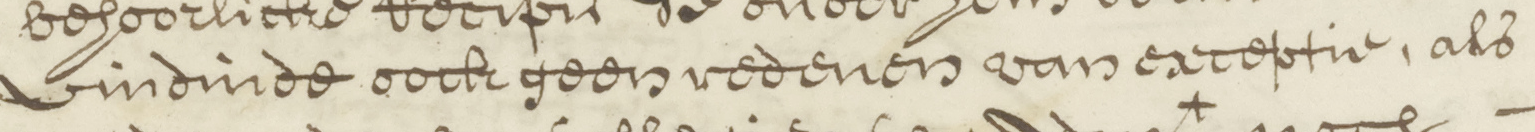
vindinde oock geen redenen van exceptie, als
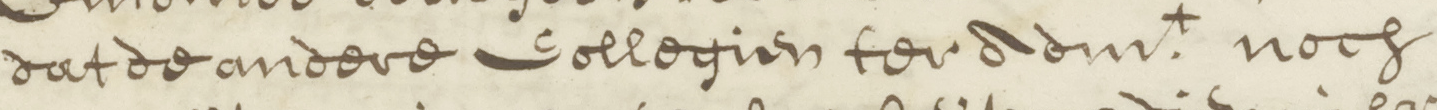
dat de andere Collegien ter Admt. noch
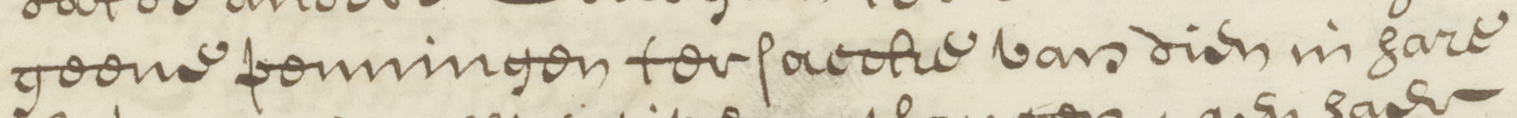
geene penningen ter saecke van dien in hare
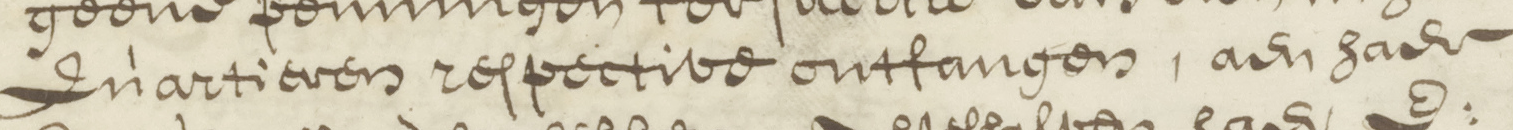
Quartieren respective ontfangen, aen haer
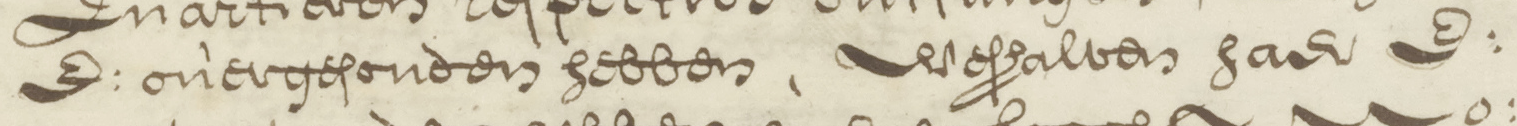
E: ouergesonden hebben, Weshalven haer E:
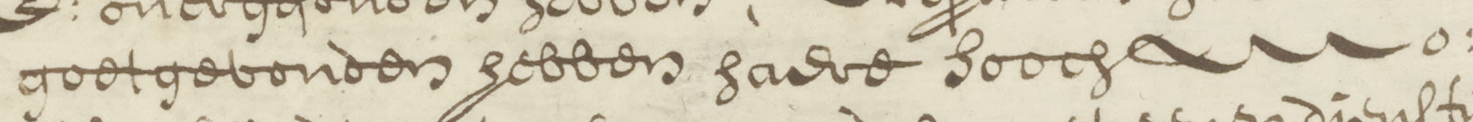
goetgevonden hebben haere hoochMo:
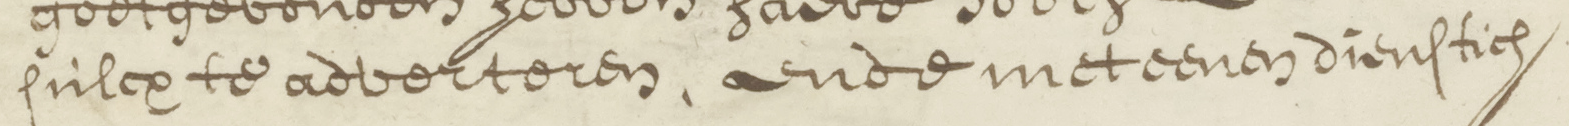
sulcx te adverteren, ende met eenen dienstich
